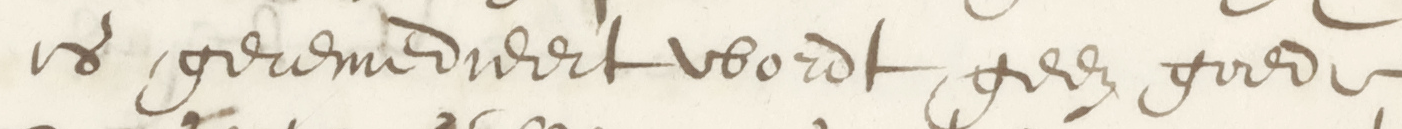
is geremedieert wordt, geen goede
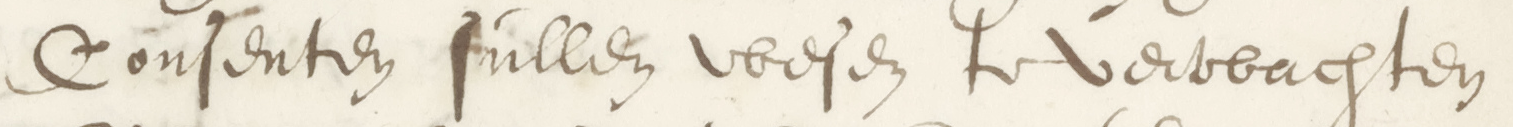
Consenten sullen wesen te verwachten
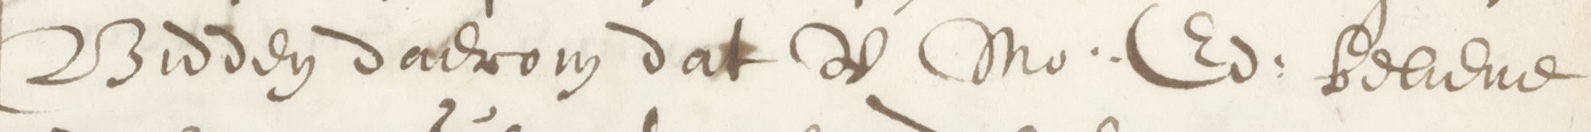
Bidden daerom dat U Mo:Ed: belieue
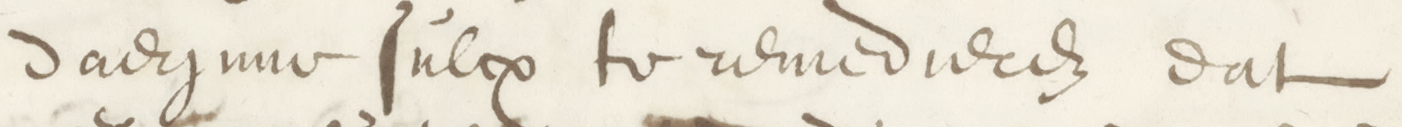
daerinne sulcx te remedieren dat
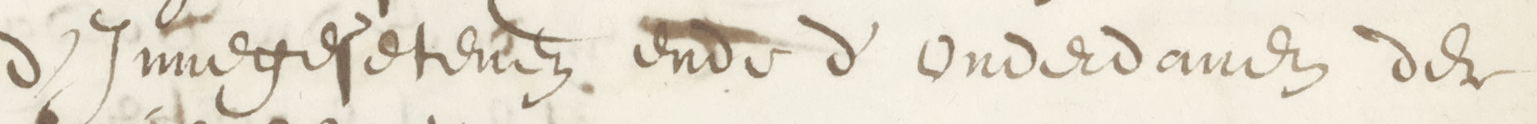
d‛Innegesetenen ende d‛onderdanen der
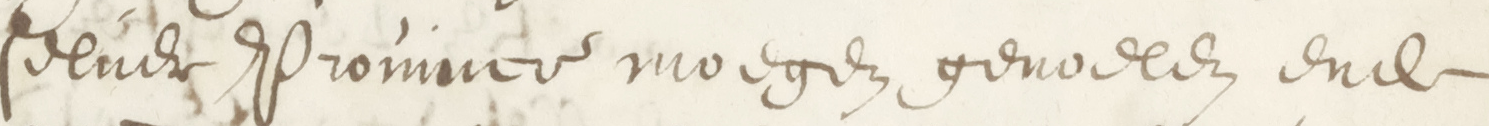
seluer Prouincie moegen geuoelen ende
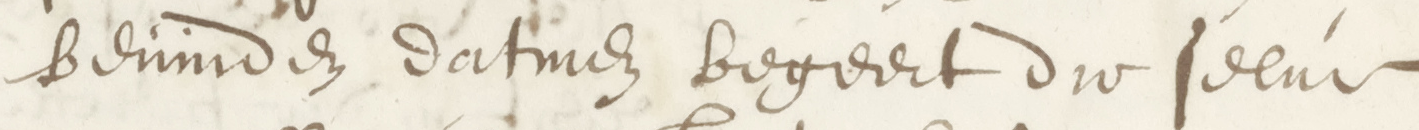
beuinden datmen begeert die selue
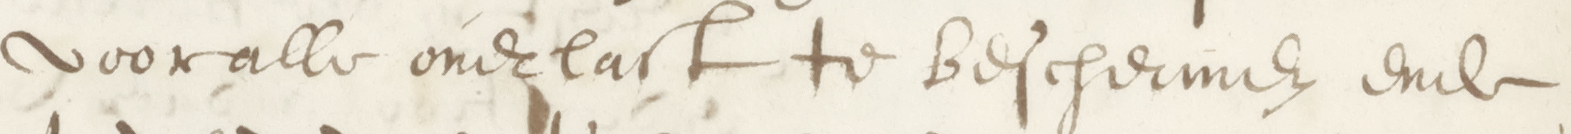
voor alle ouerlast te beschermen ende
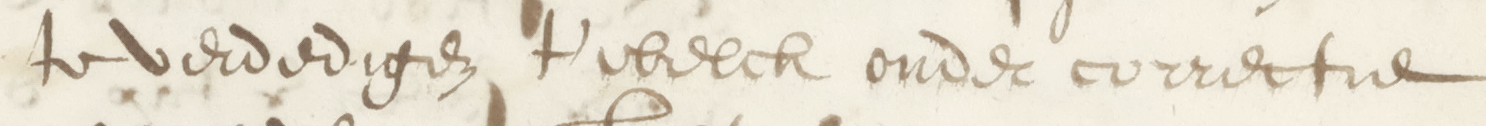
te verdedigen t‛welck onder correctie
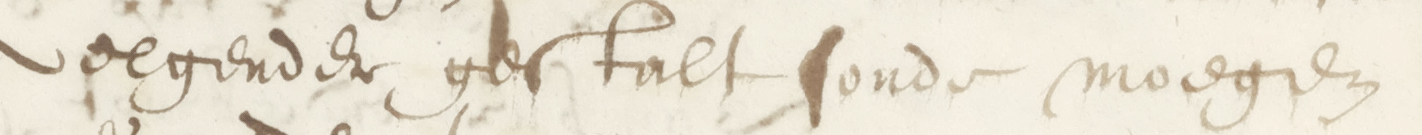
volgender gestalt soude moegen
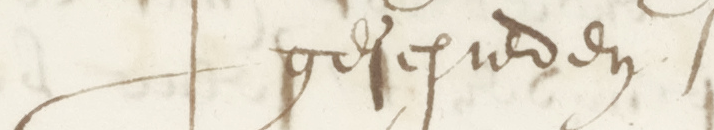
geschieden.
